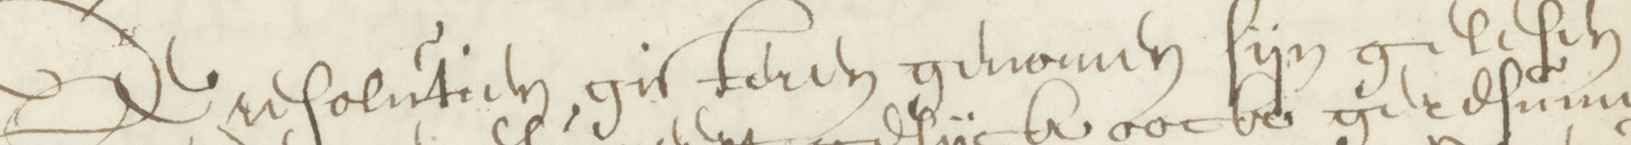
De resolutien gisteren genomen sijn gelesen
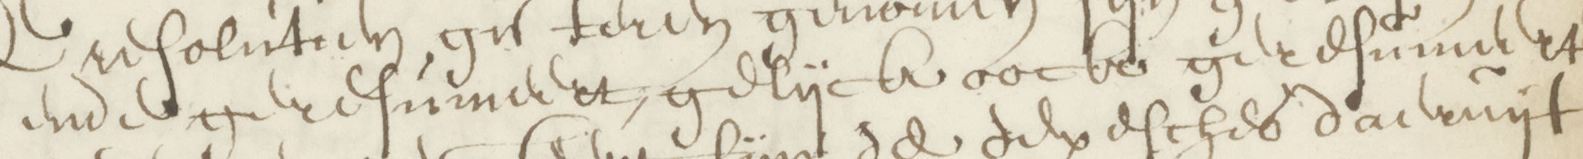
ende geresumeert, gelijck oock geresumeert
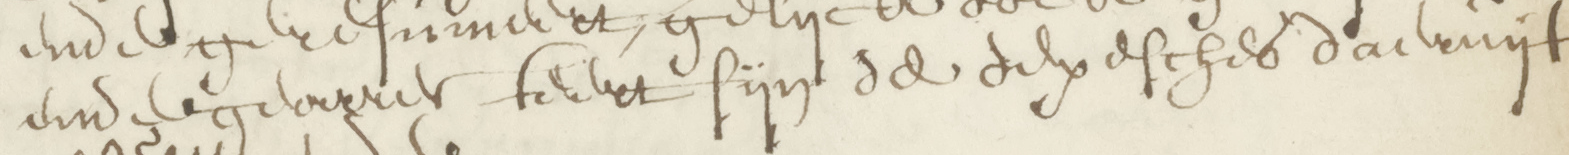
ende gearresteert sijn de depesches daeruijt
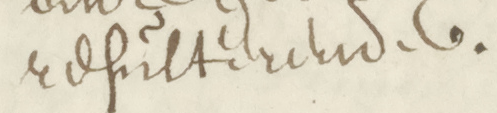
resulterende.
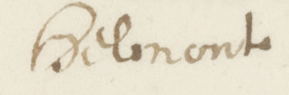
Helmont
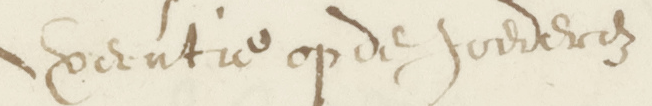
Executie opde Goederen
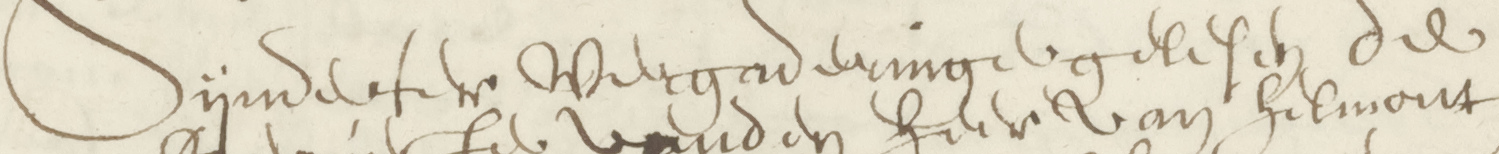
Sijnde ter Vergaderinge gelesen de
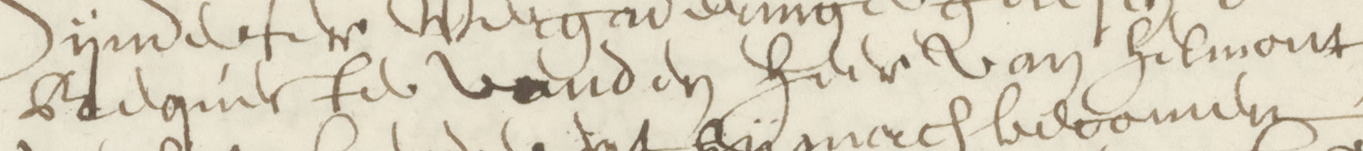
Requeste vanden heer van helmont,
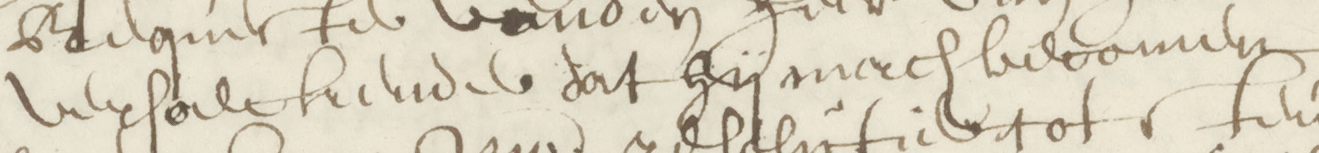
versoeckende dat hij mach becomen
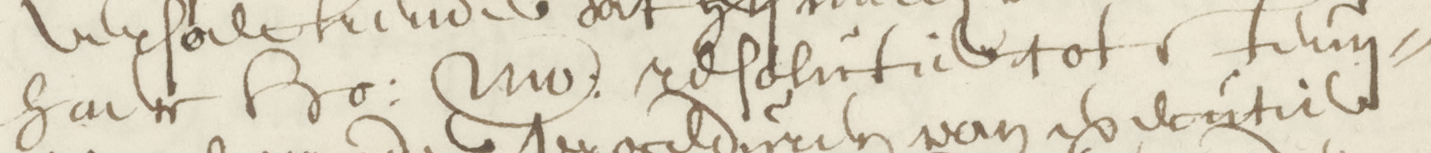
haer Ho:Mo: resolutie tot steuij„
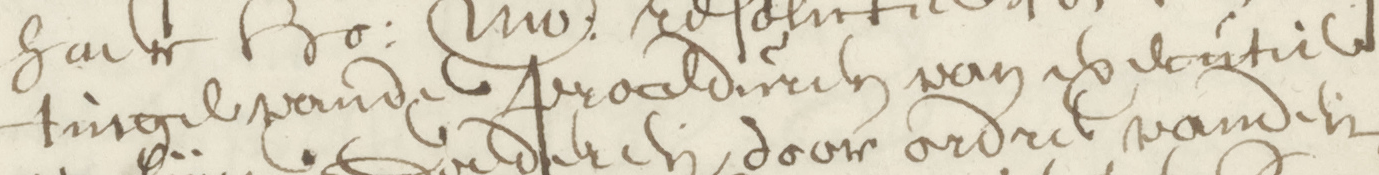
tinge vande proceduren van executie
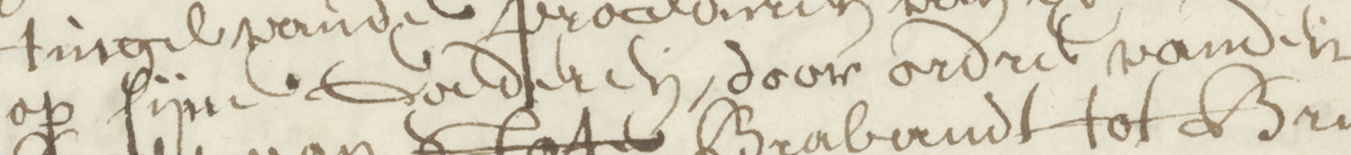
op sijne Goederen, door ordre vanden
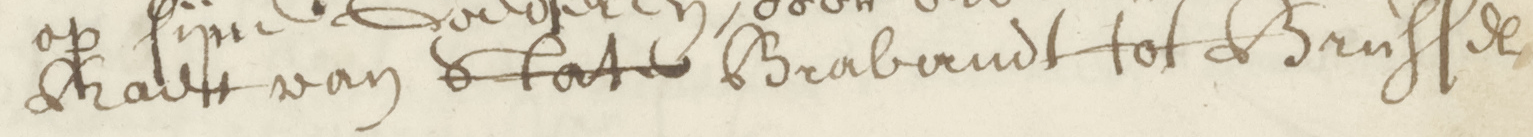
Raet van State Brabandt tot Brussel
